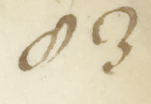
83
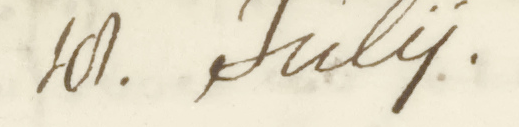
18. Julij.
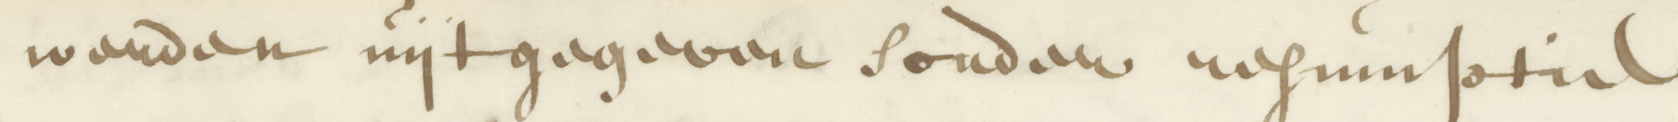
werden uijtgegeven sonder resumptie
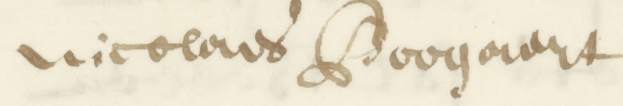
Nicolaes Boogaert
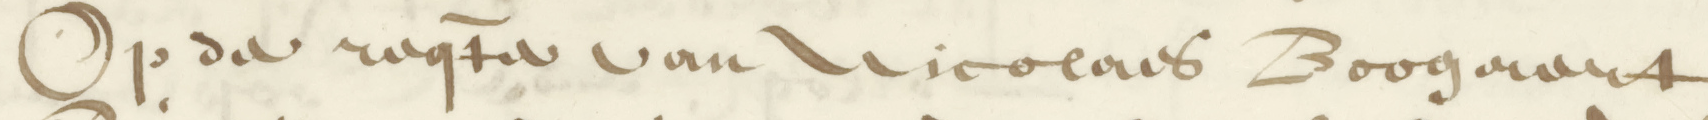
Op de reqte van Nicolaes Boogaert
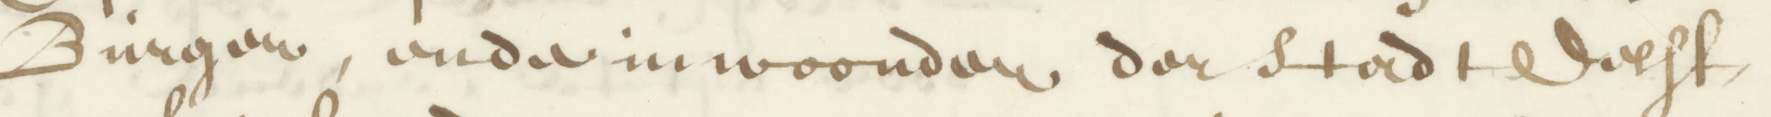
Burger, ende inwoonder der Stadt Delft
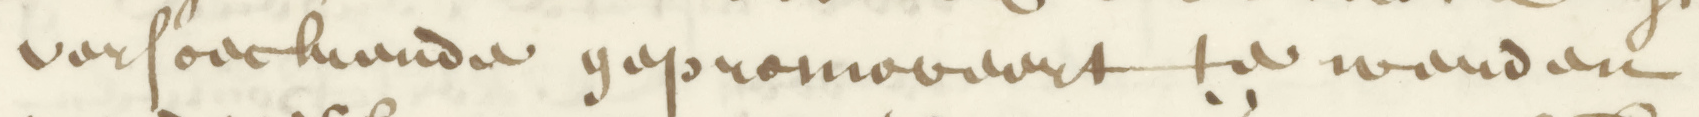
versoeckende gepromoveert te werden
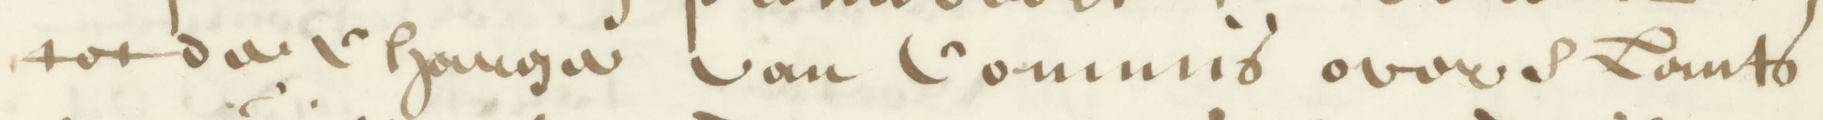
tot de Charge van Commis over sLants
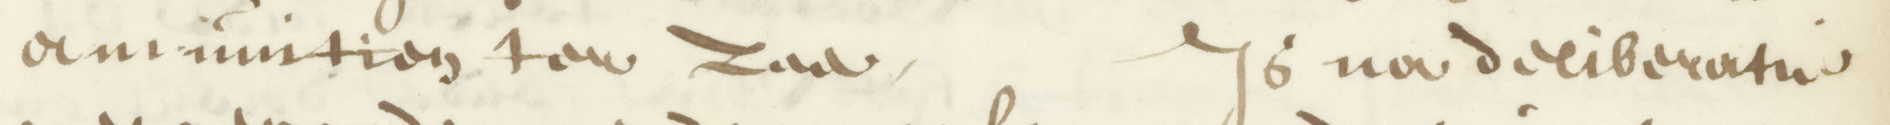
amunitien ter Zee. Is na deliberatie
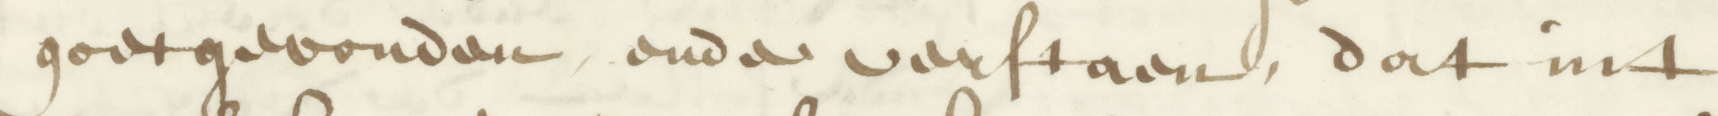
goetgevonden, ende verstaen, dat int
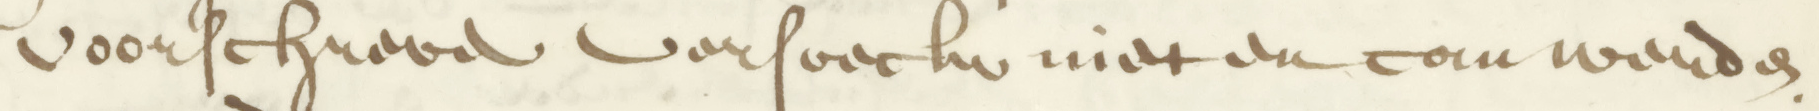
voorschreve versoeck niet en can worden
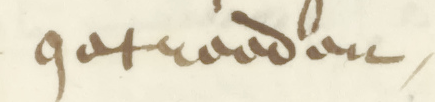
getreeden.
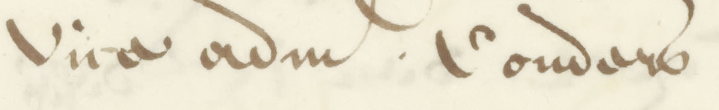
Vice adml. Conders
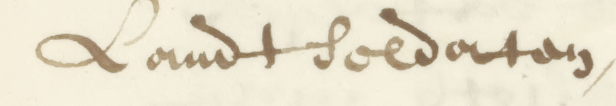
Landt soldaten
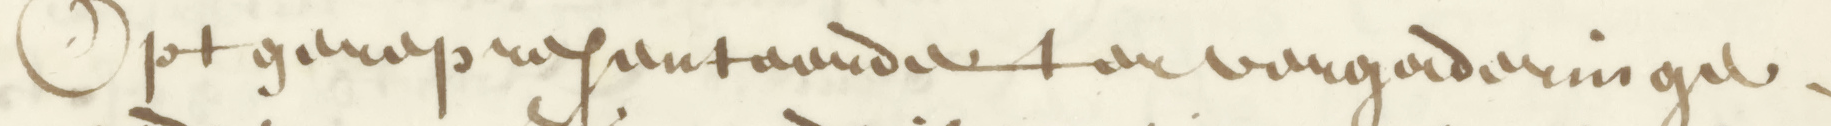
Opt gerepresenteerde ter vergaderinge
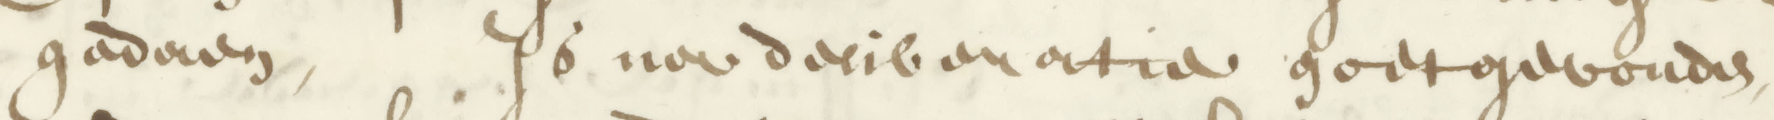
gedaen, Is na deliberatie goetgevonden
